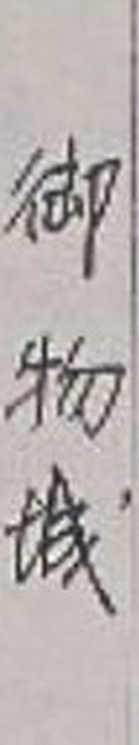御物城
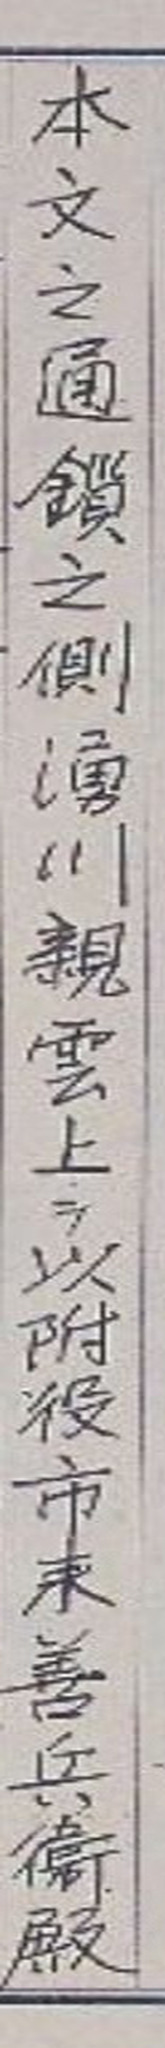本文之通鎖之側湧川親雲上を以附役市来善兵衛殿
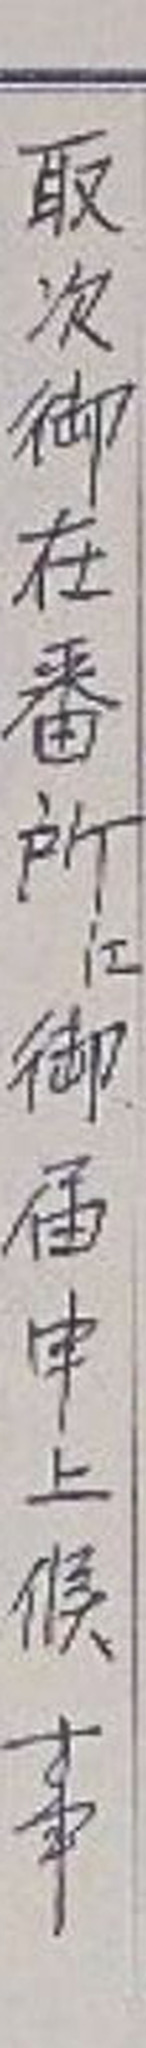取次御在番所え御届申上候事
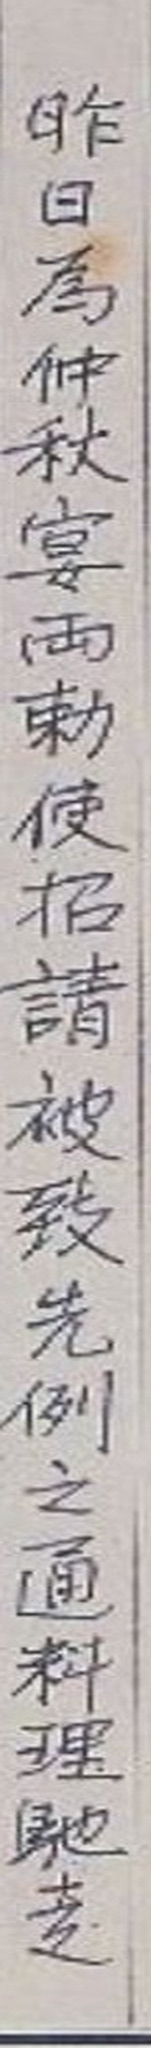昨日為仲秋宴両勅使招請被致先例之通料理馳走
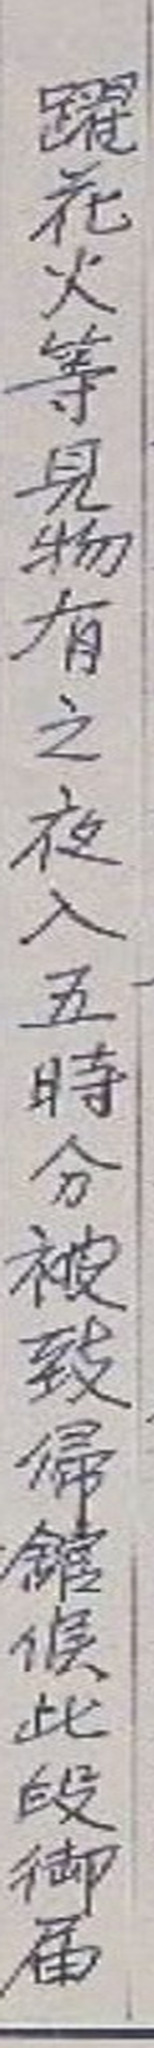躍花火等見物有之夜入五時分被致帰館候此段御届
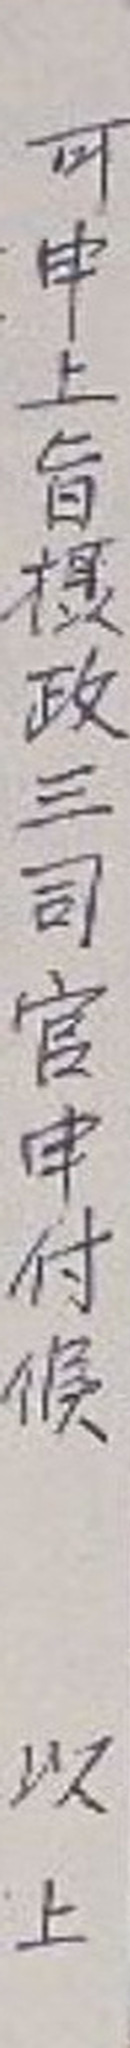可申上旨摂政三司官申付候以上
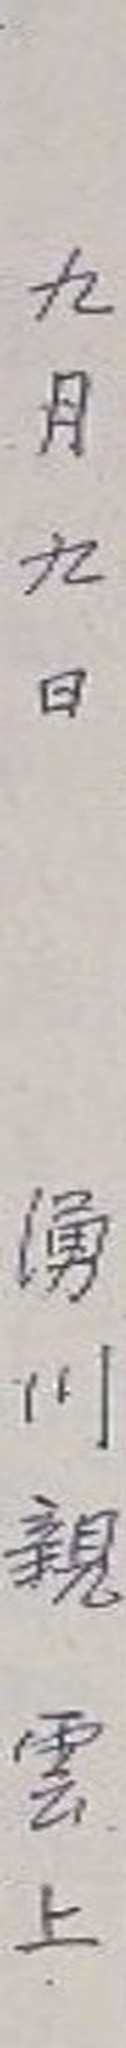九月九日湧川親雲上
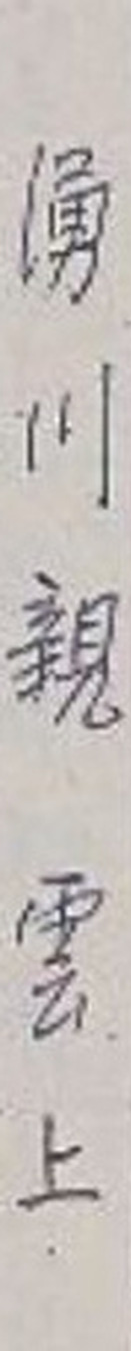湧川親雲上
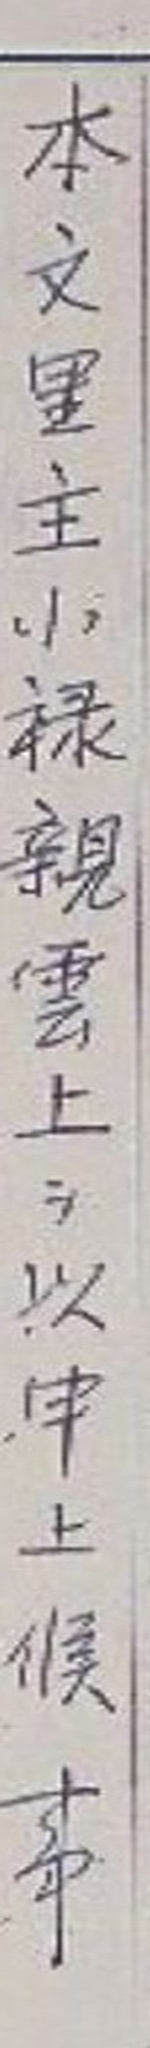本文里主小禄親雲上を以申上候事
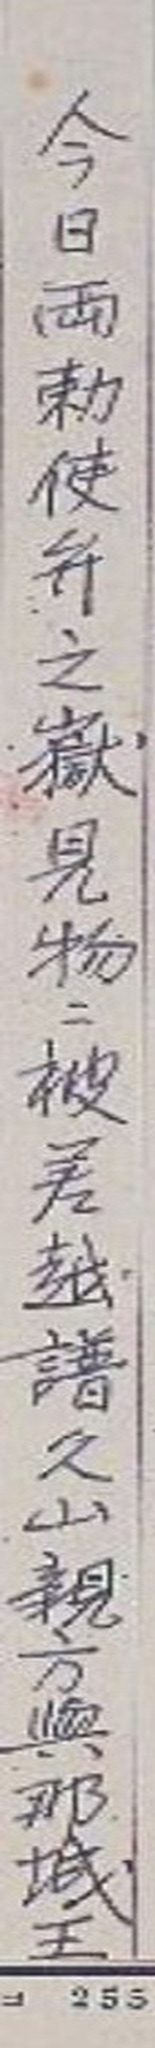今日両勅使弁之嶽見物に被差越譜久山親方与那城王
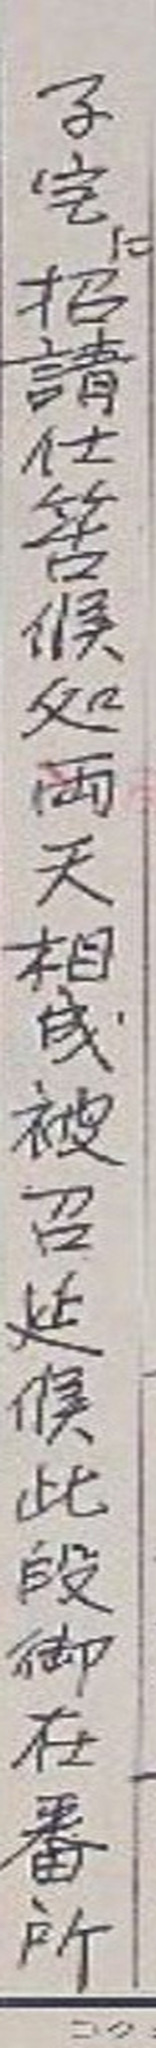子宅え招請仕筈候処両天相成被召延候此段御在番所
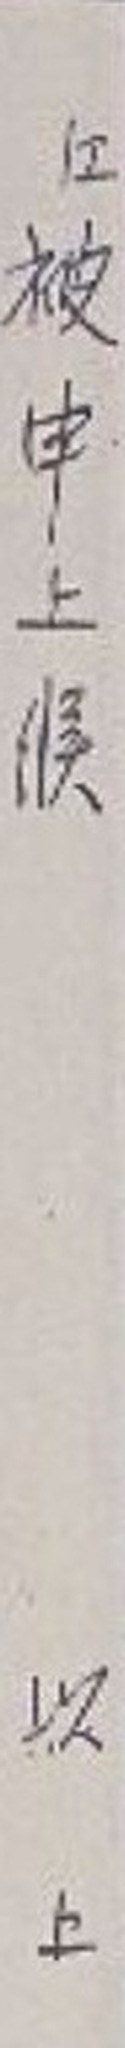え被申上候以上
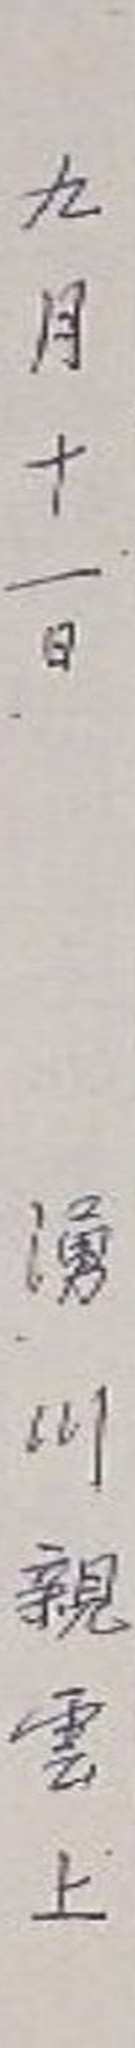九月十一日湧川親雲上
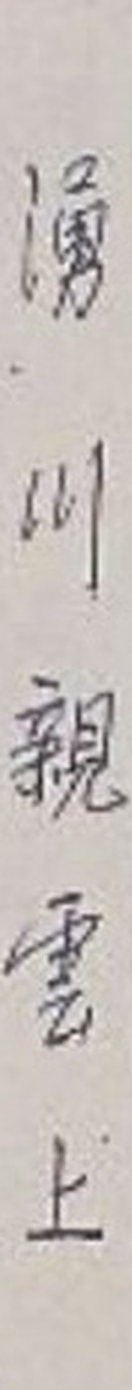湧川親雲上
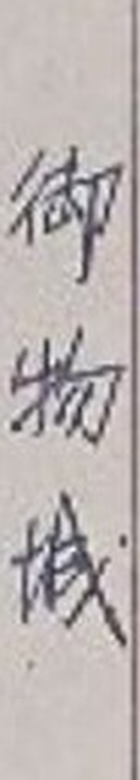御物城
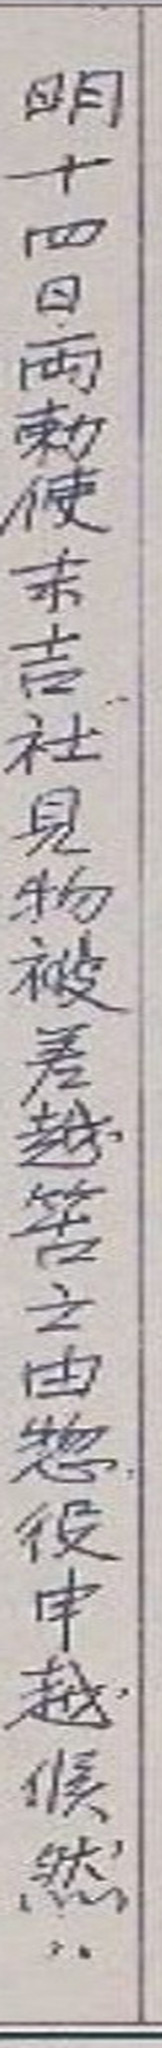明十四日両勅使末吉社見物被差越筈之由惣役申越候然は
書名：支那冊封使来琉諸記 下巻
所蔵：University of the Ryukyus Library
